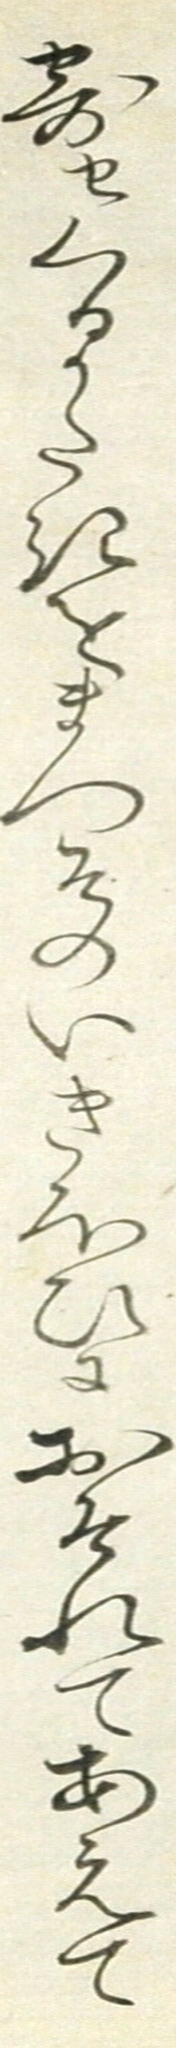寄せくるかたきをまつそのいきほひにおそれてあえて
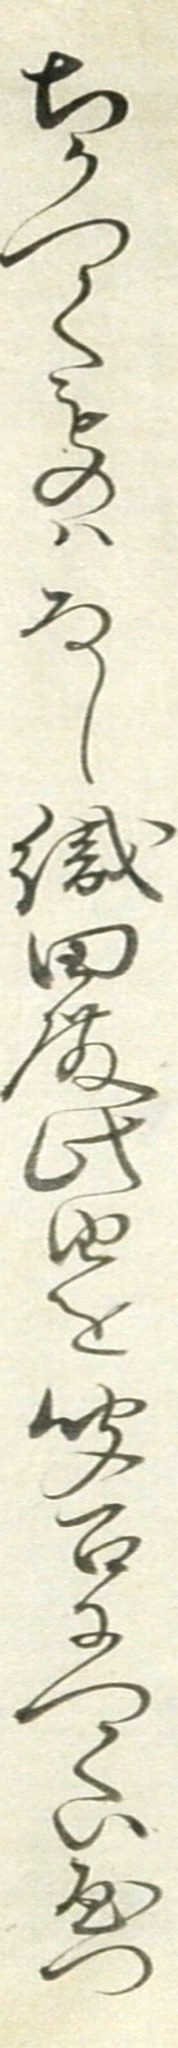ちかつくものはなし織田殿此由を聞召につくいやつ
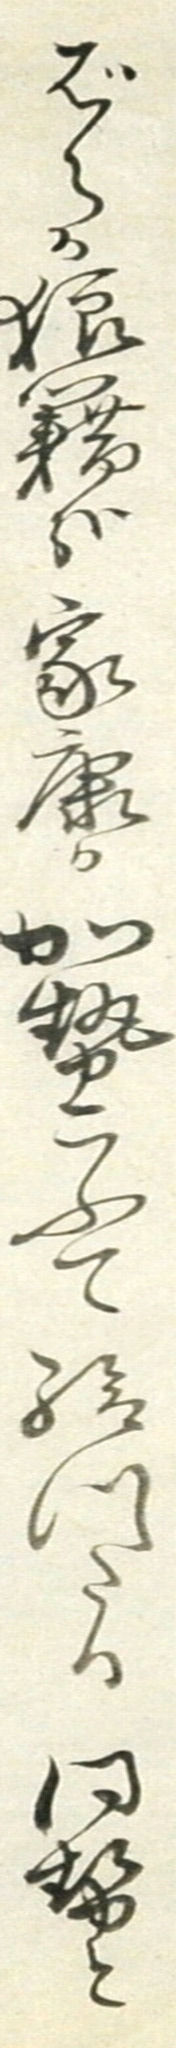ばらか狼藉哉家康か加勢こふて給つたる同勢と
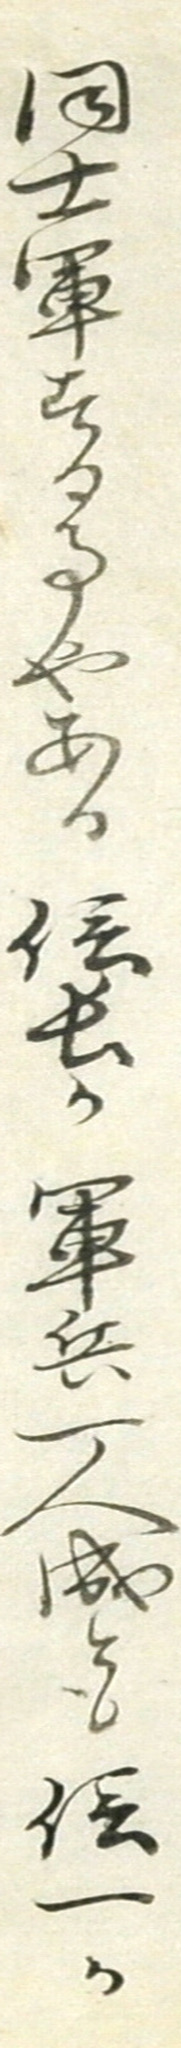同士軍する事やある信長か軍兵一人成とも信一か
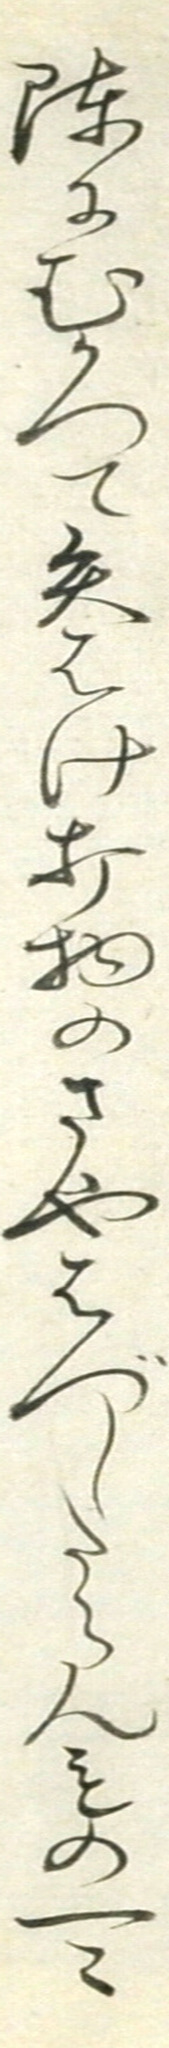陣にむかつて矢はけ打物のさやはづしたらんもの一々
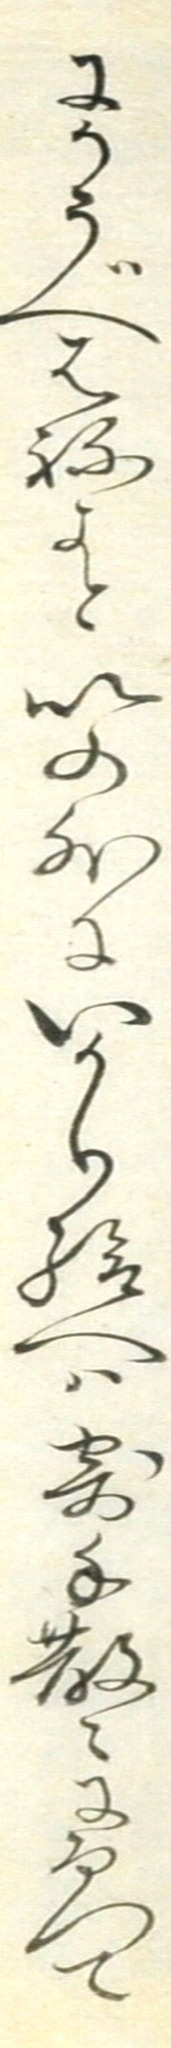にかうべはねよと以の外にいかり給へは寄手散々になつて
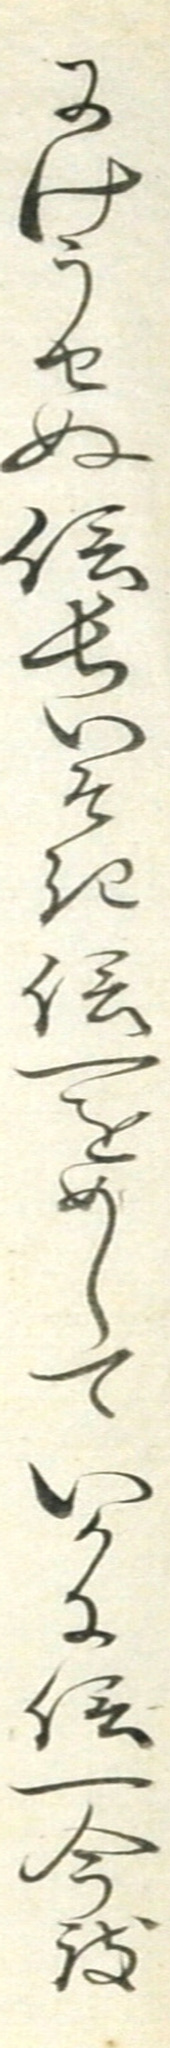にけうせぬ信長いそき信一をめしていかに信一今度
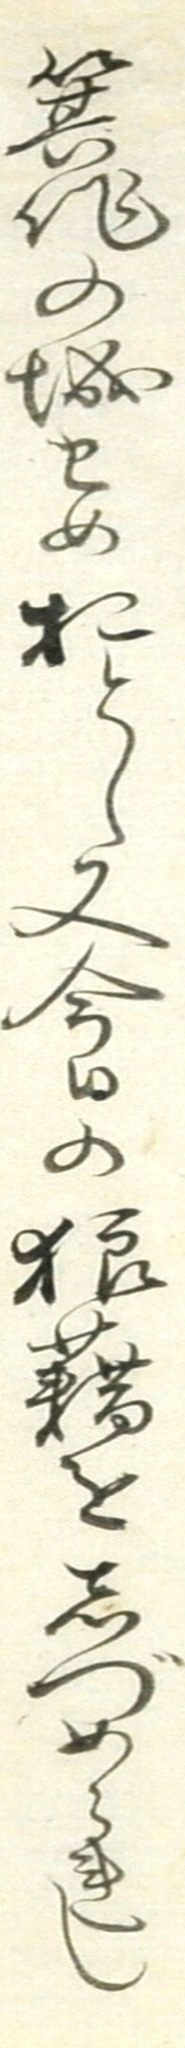箕作の城せめおとし又今日の狼藉をしづめられし
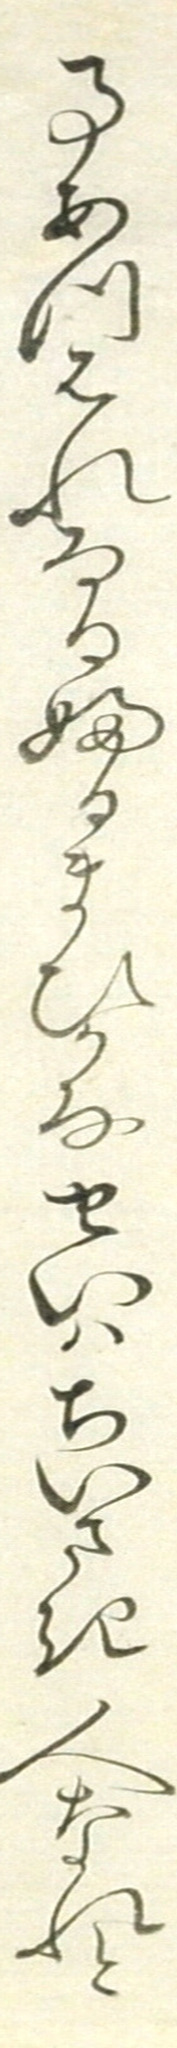事あつはれなるふるまひかなせいはちいさき人なれと
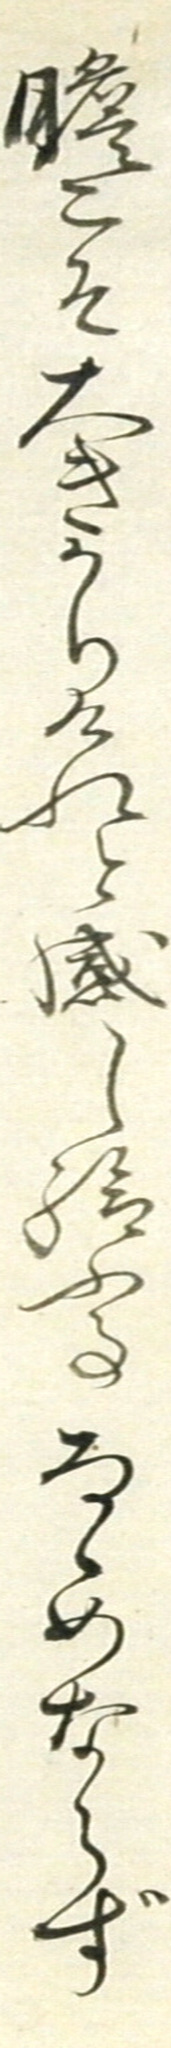胆こそ大きかりけれと感し給ふ事なゝめならず
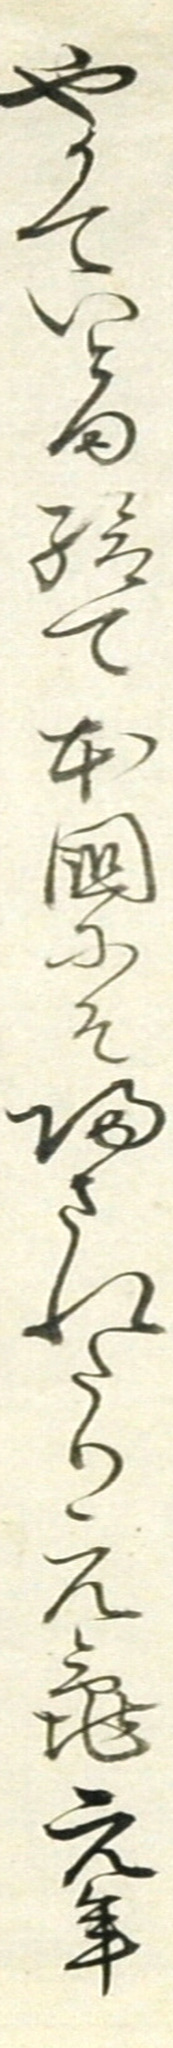やかていとま給て本国にそ帰されたり元亀元年
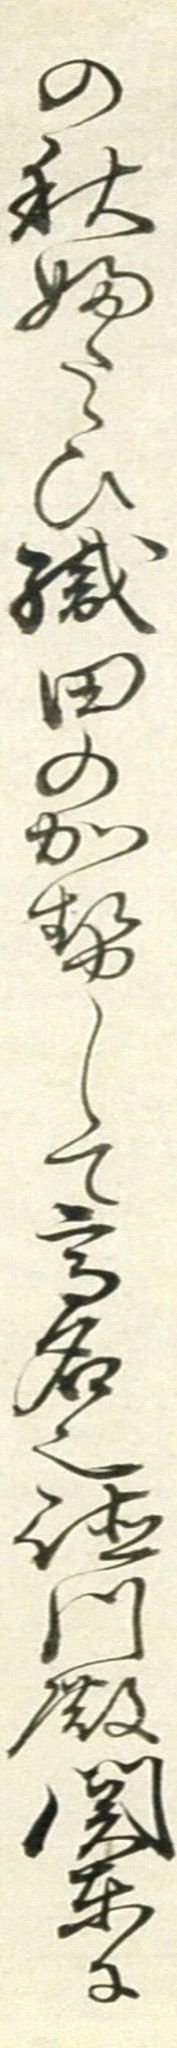の秋ふたゝひ織田の加勢して高名也徳川殿関東に
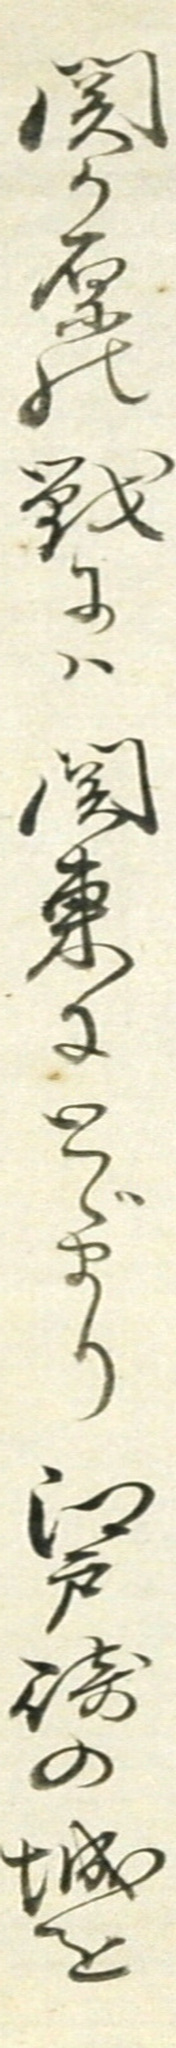関か原の戦には関東にとゞまり江戸崎の城を
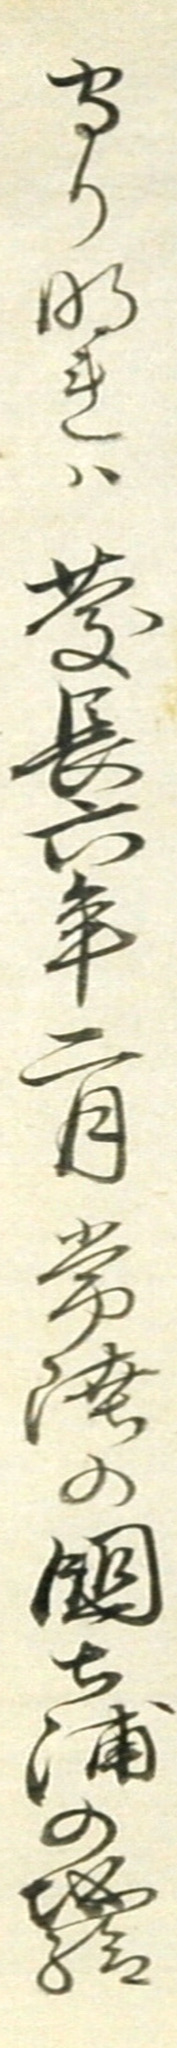守り明れは慶長六年二月常陸の国土浦の城給

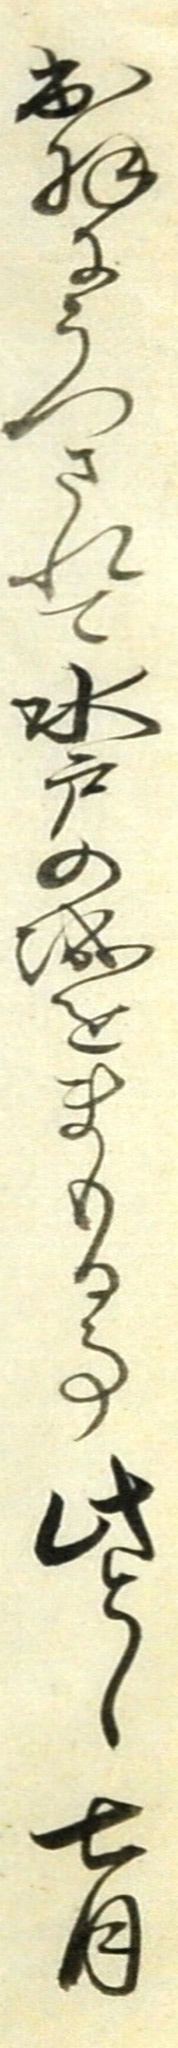出羽にうつされて水戸の城をまもる事此とし七月
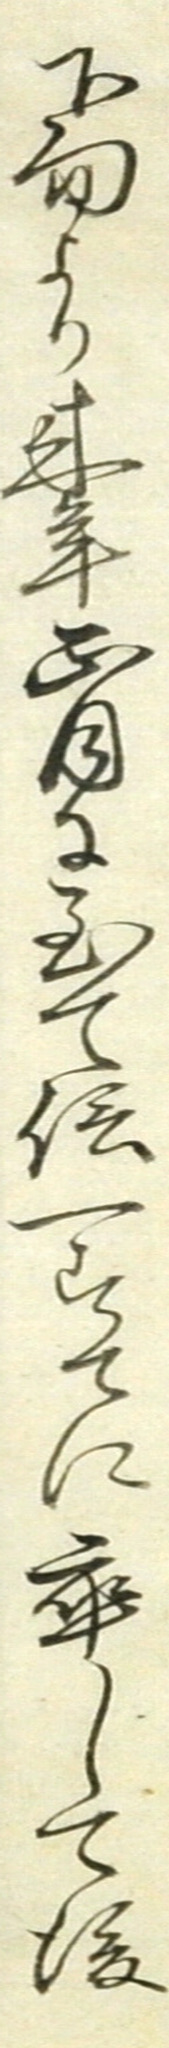下旬より来年正月に至て信一すてに卒して後
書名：藩翰譜（二・三）
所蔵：伊那市立高遠町図書館・合同会社AMANE
